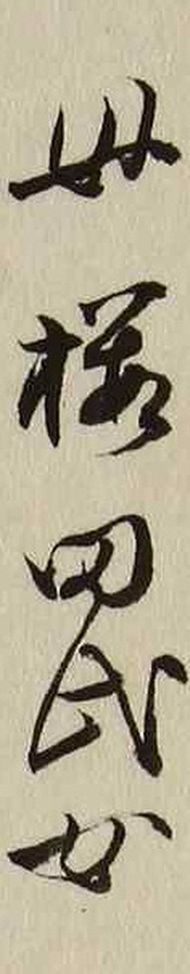母桜田氏女
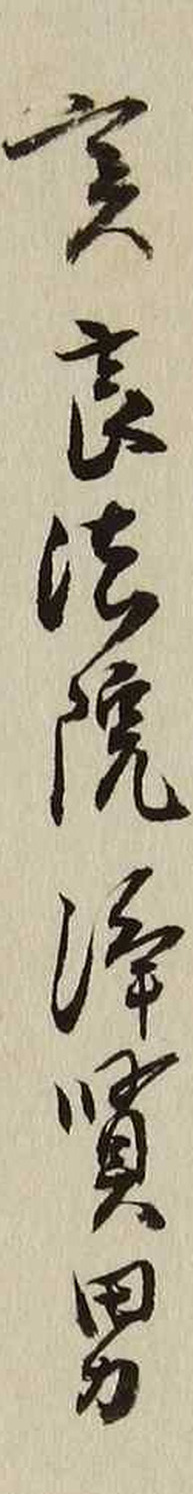実良法院浄賢男
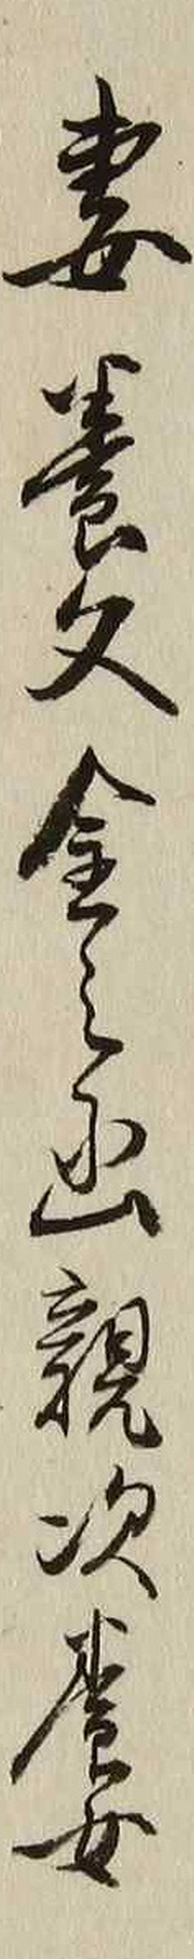妻養父金之丞親次養女
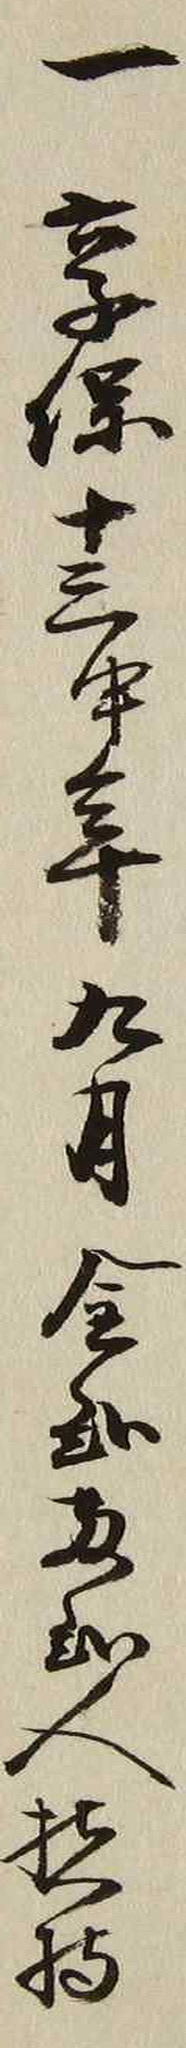一享保十三申年九月金弐両弐人扶持
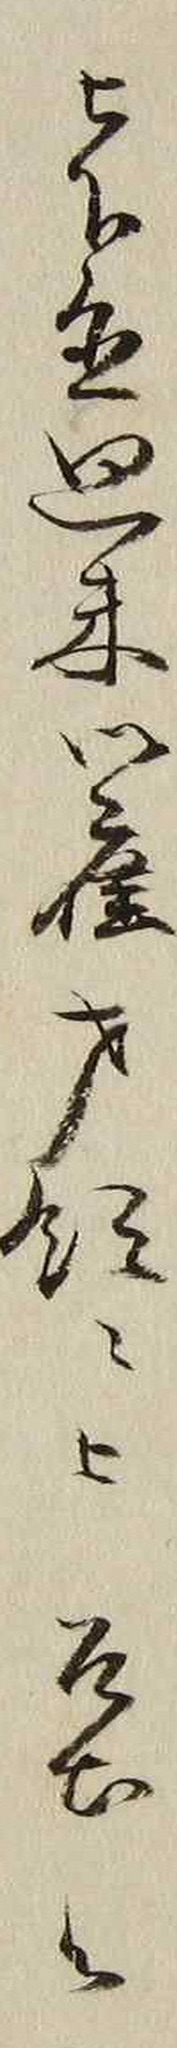被下置廻米御雇才領ニ被召出候
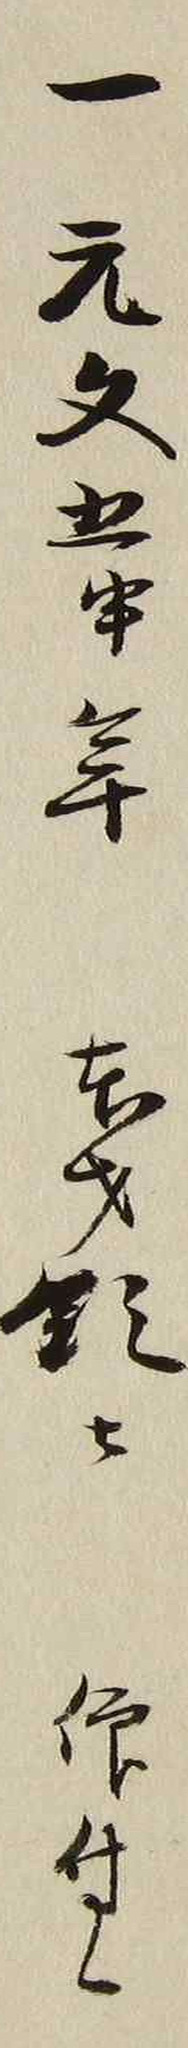一元文五申年本才領被仰付候
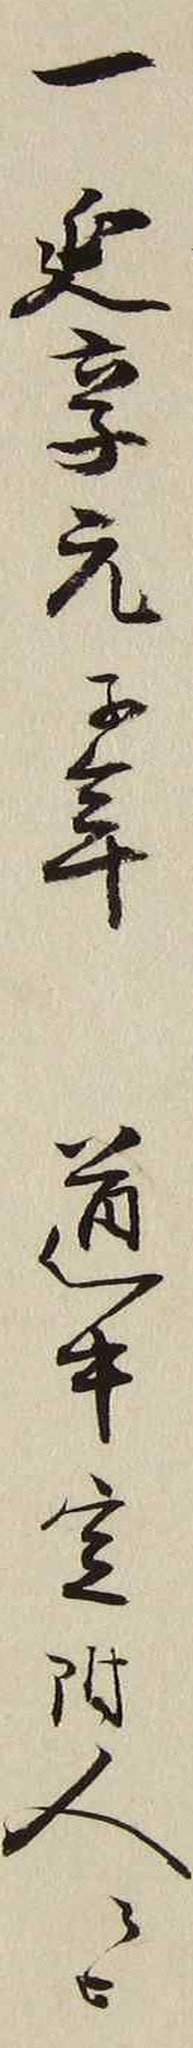一延享元子年道中定附人ニ被
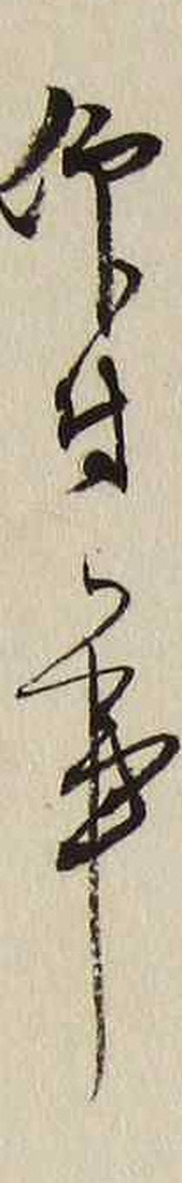仰付候事
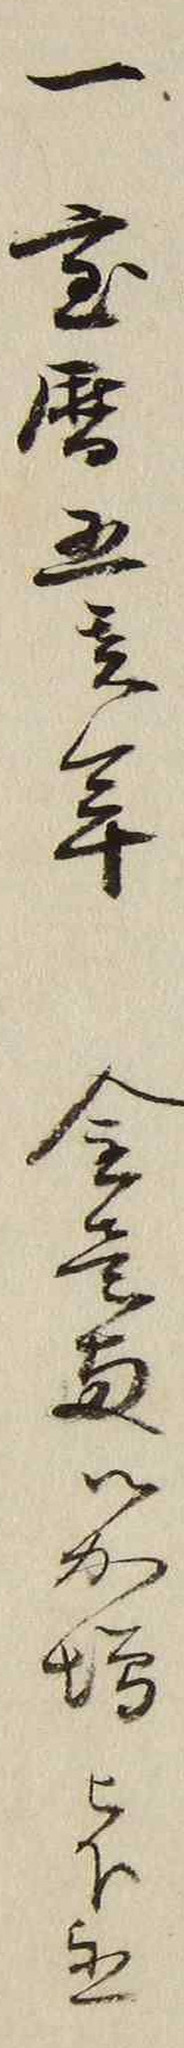一宝暦五亥年金壱両御加増被下置

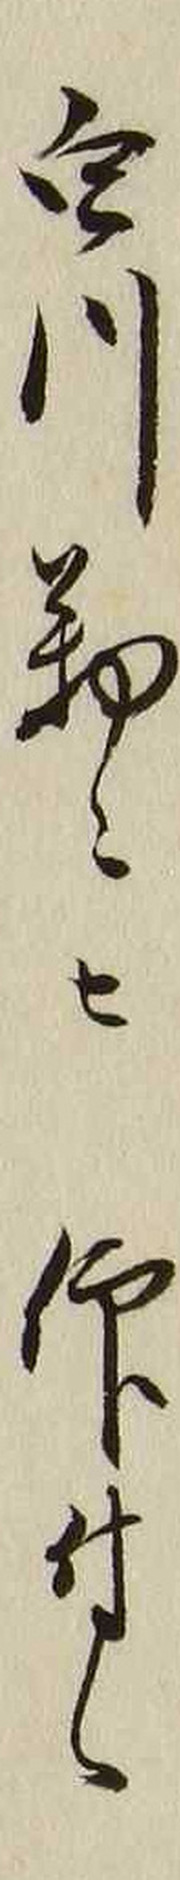白川勤ニ被仰付候
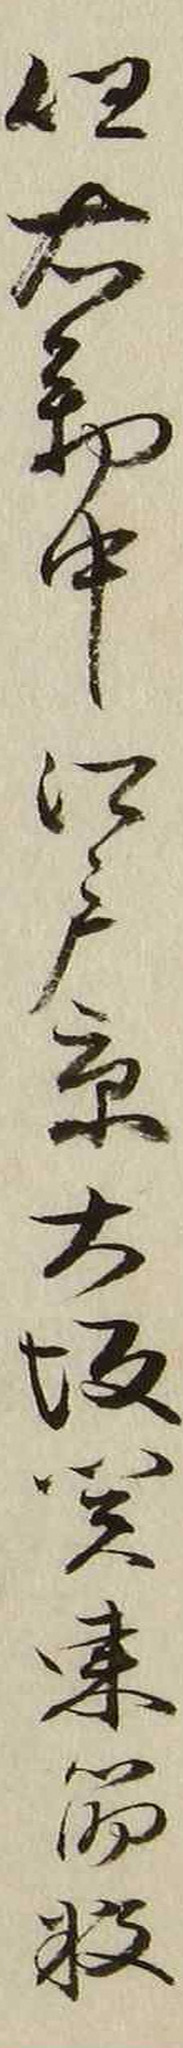但右勤中江戸京大坂関東筋数
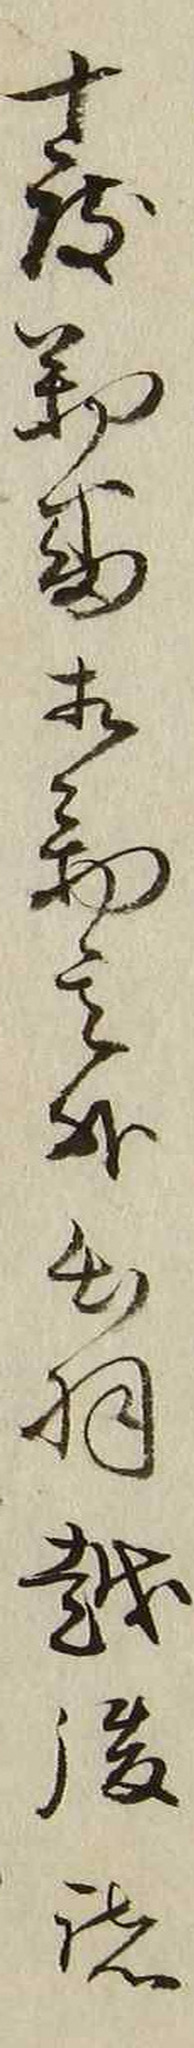十度勤番相勤其外出羽越後諸
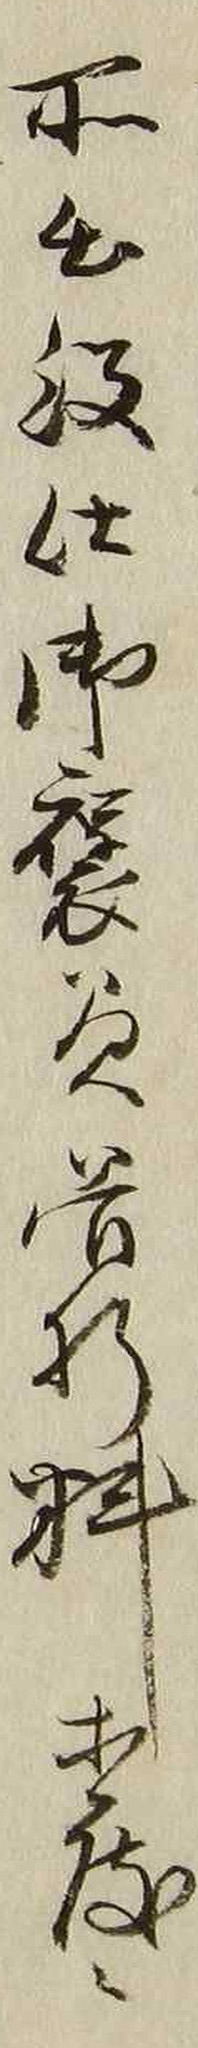所出役仕御褒美骨折料等度々
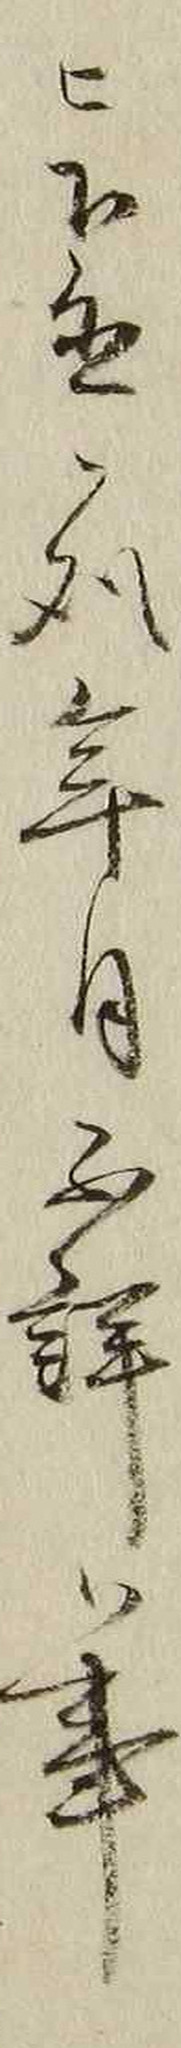被下置候処年月不詳候事
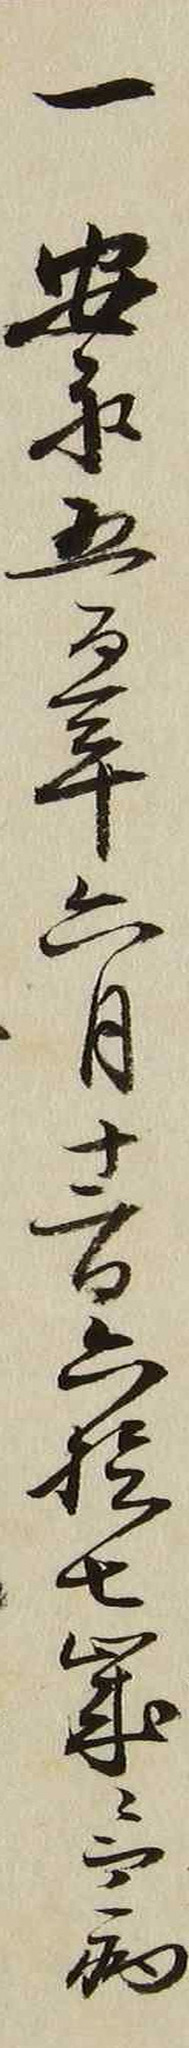一安永五酉年六月十二日六拾七歳ニ而病
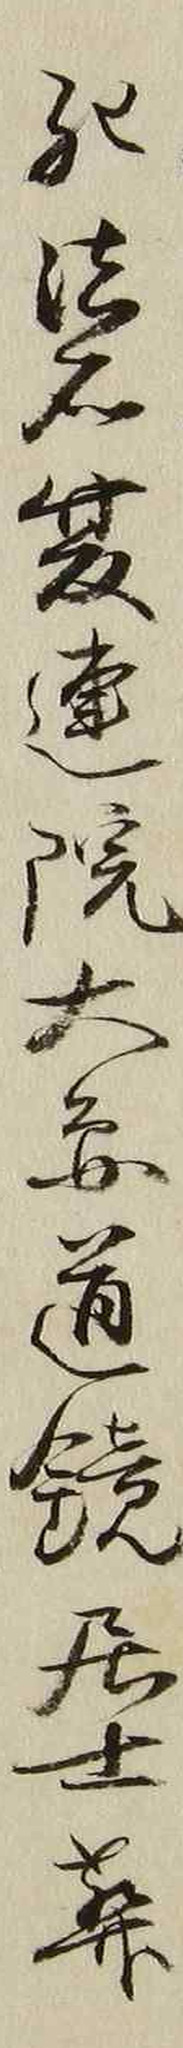死法名夏連院大円道鏡居士葬
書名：諸士系譜　巻之291　さ之部23
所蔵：会津若松市立会津図書館
